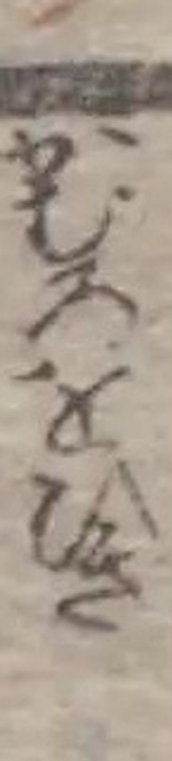かむろをひき
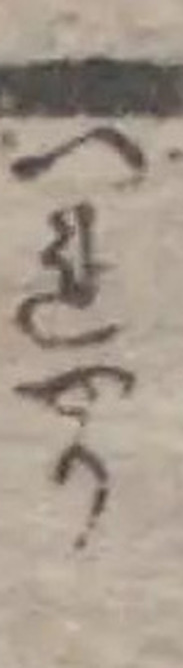つれやり
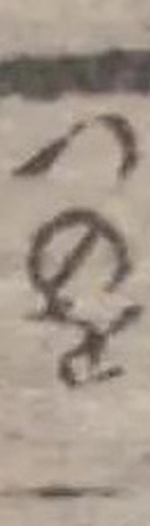つのを
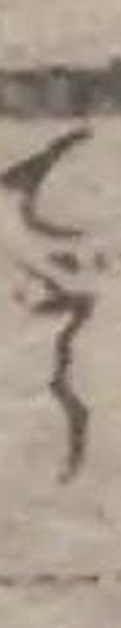てどう
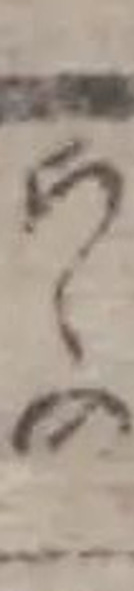らくの
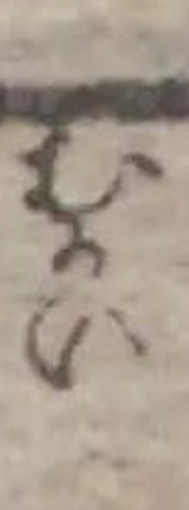むかい
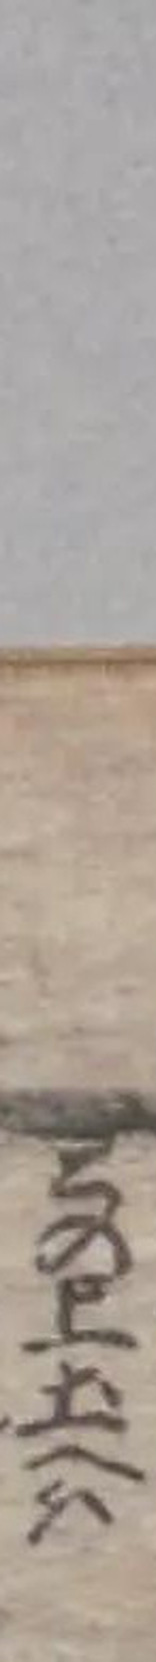この上土へは
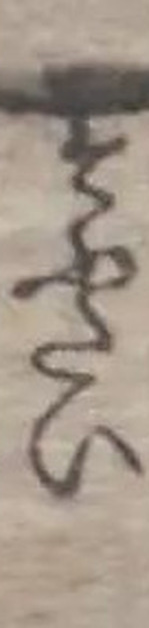そふたい
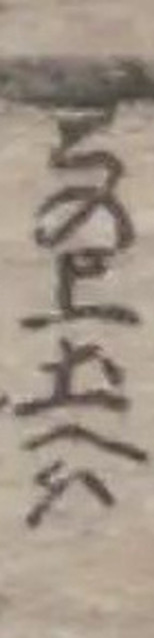この上土へは
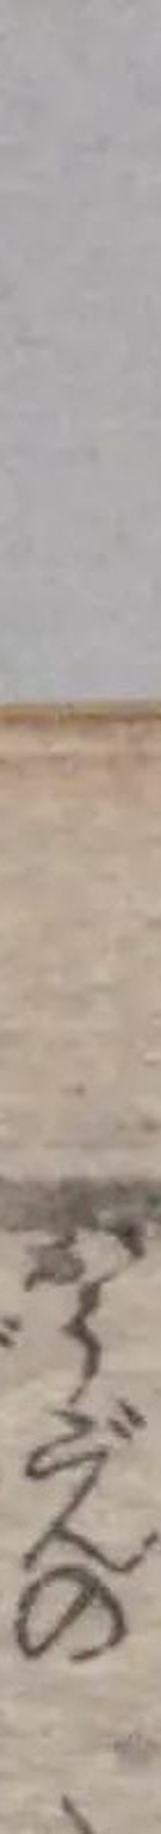おうごんの
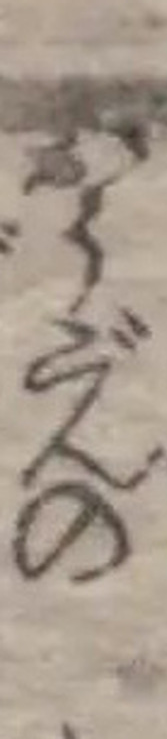おうごんの
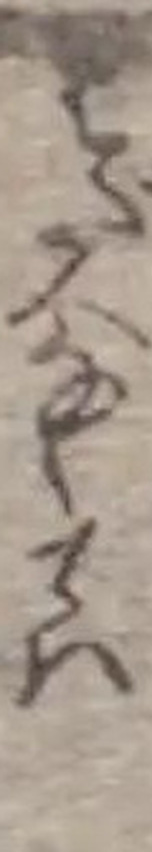はだへなくては
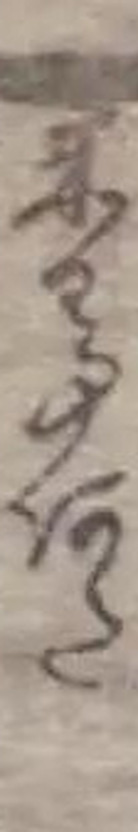来る事あた
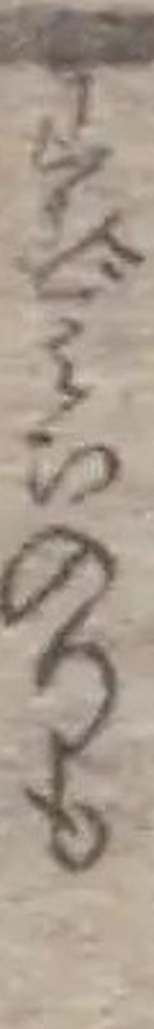わずみちのりも
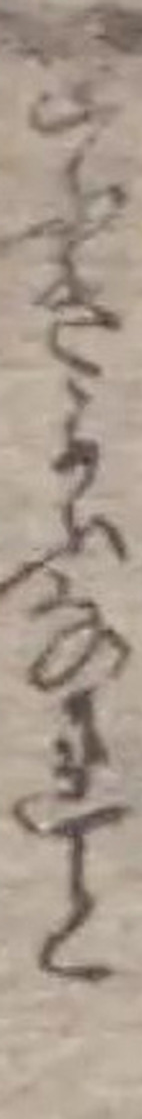とふきよふなれと
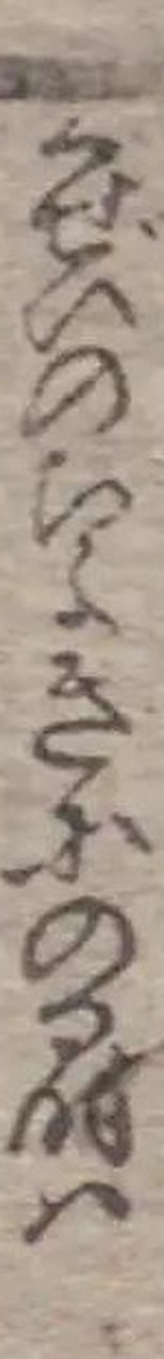くぜいのちよきにのる時は
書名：早出来 3巻
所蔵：国立国会図書館 National Diet Library, JAPAN
